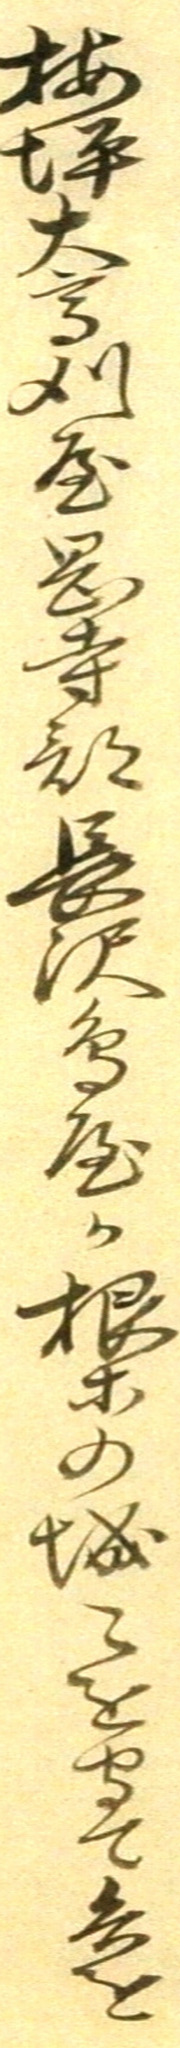梅坪大高刈屋岡寺部長沢鳥屋か根等の城々を守て兵を
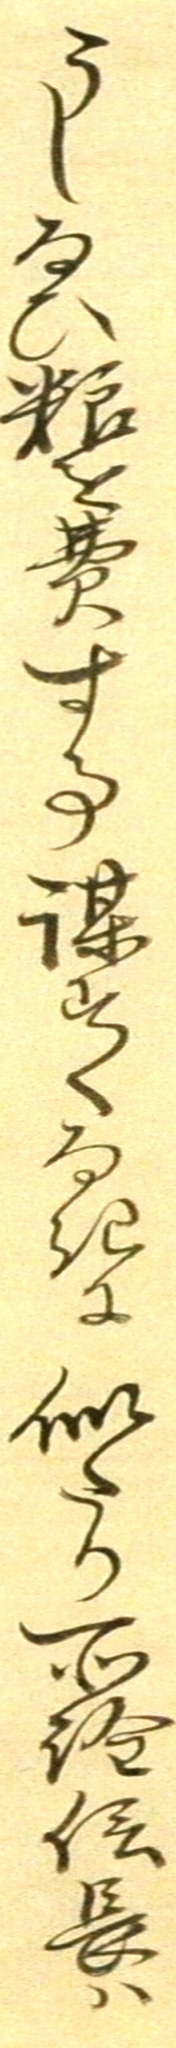うしなひ粮を費す事謀すくなきに似たり所詮信長は
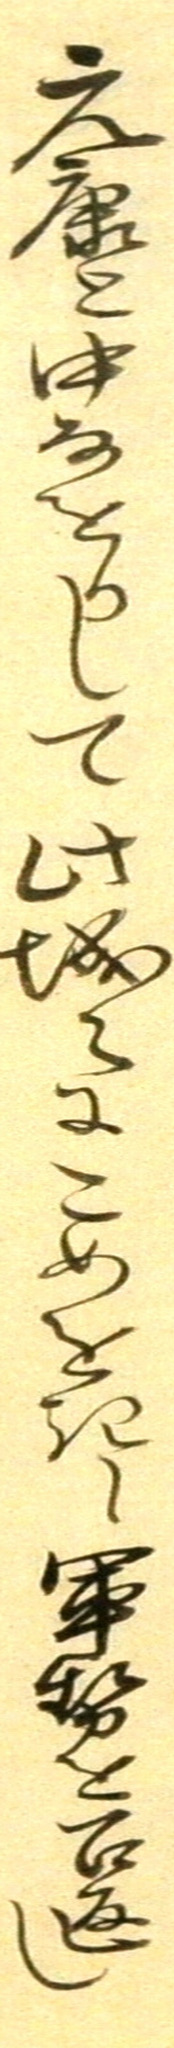元康と中なをりして此城々にこめをきし軍勢を召返し
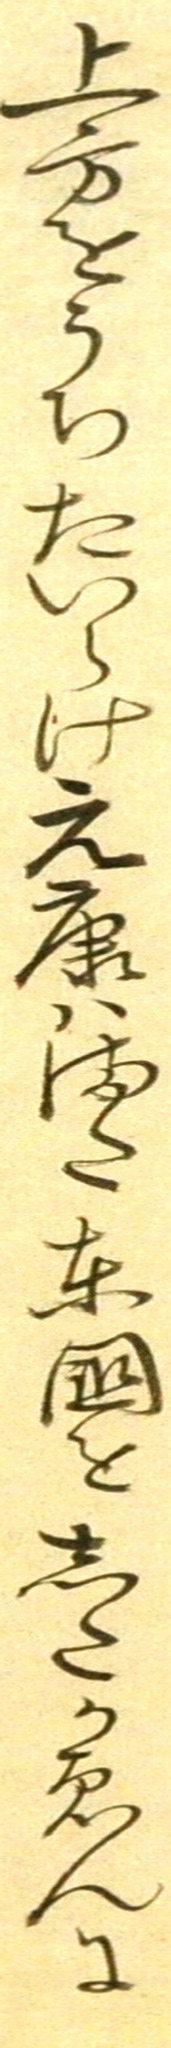上方をうちたいらけ元康はまた東国をしたかゑんに
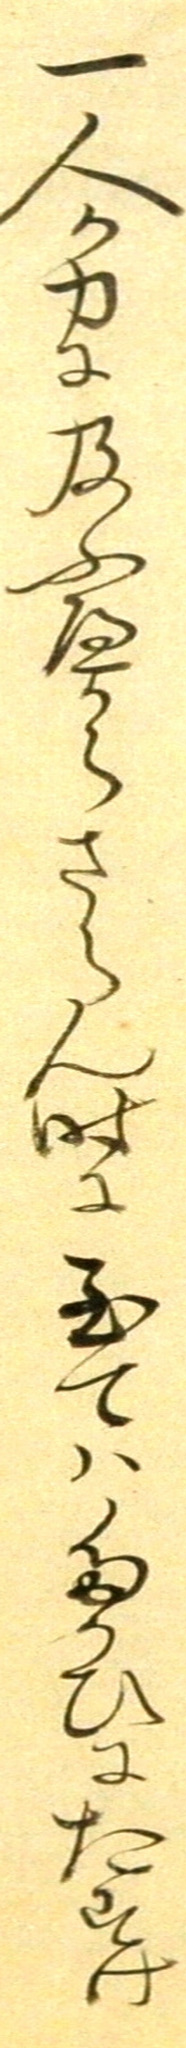一人か力に及ふへからさらん時に至てはたかひにたすけ
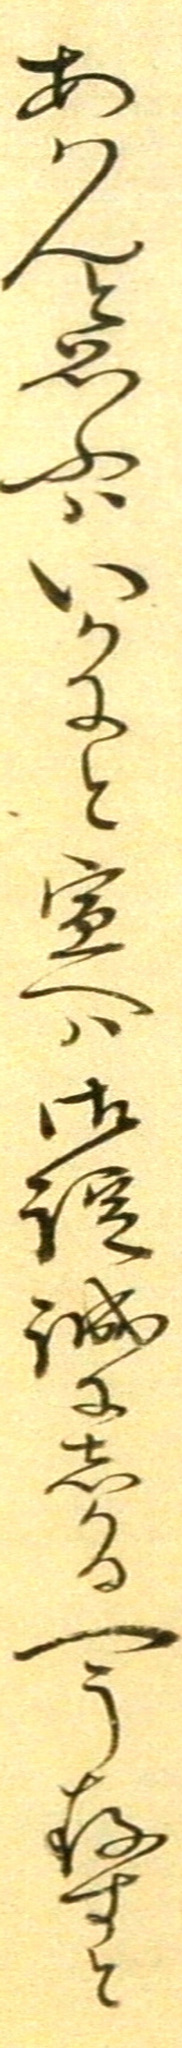あわんと思ふはいかにと宣へは御諚誠にしかるへう存すと
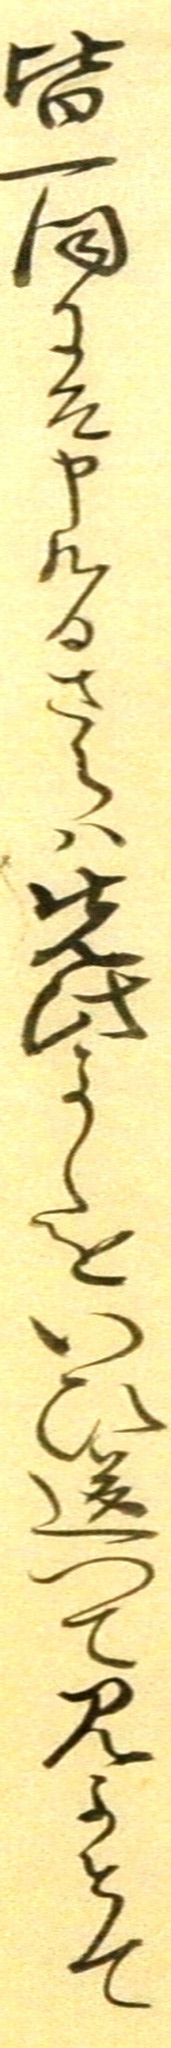皆一同にそ申けるさらは先此よしをいひ送つて見よとて
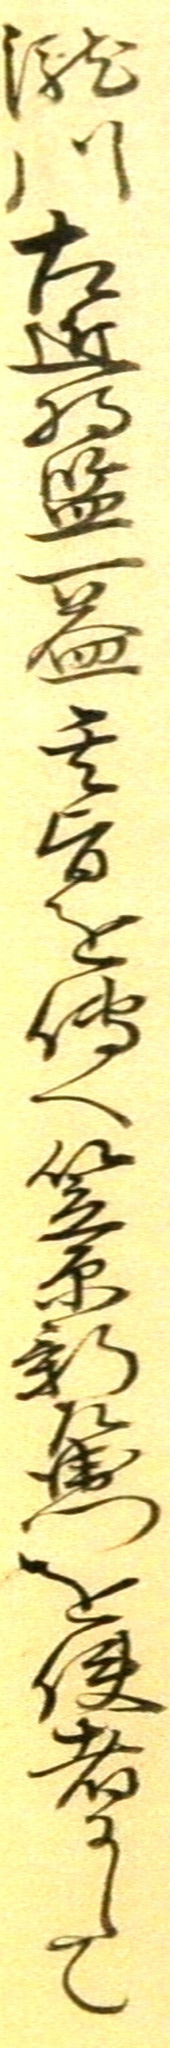滝川左近将監一益其旨を伝へ笠原新左衛門を使者にして

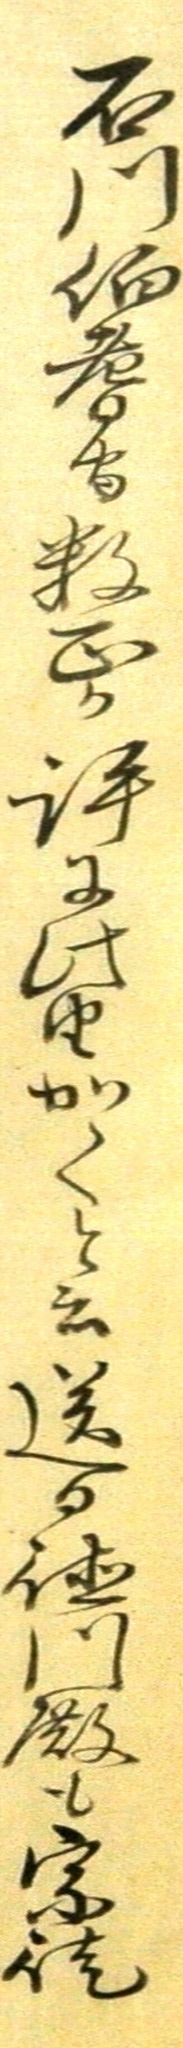石川伯耆守数正か許に此由かくと云送る徳川殿も宗徒
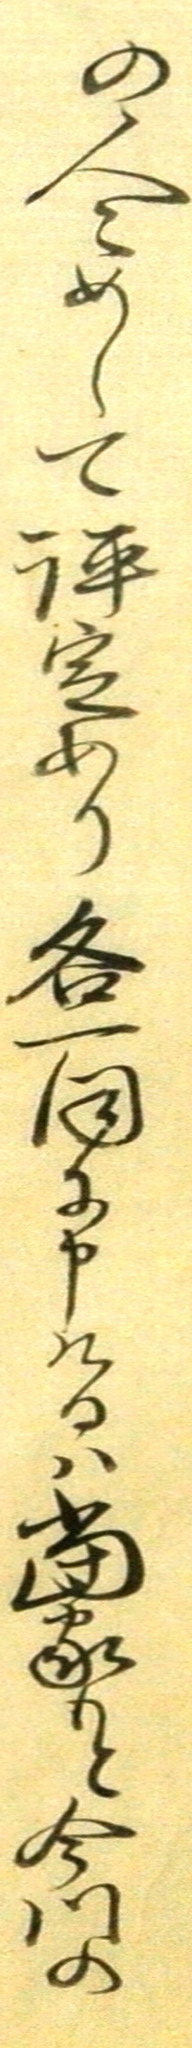の人々めして評定あり各一同に申けるは当家もと今川の
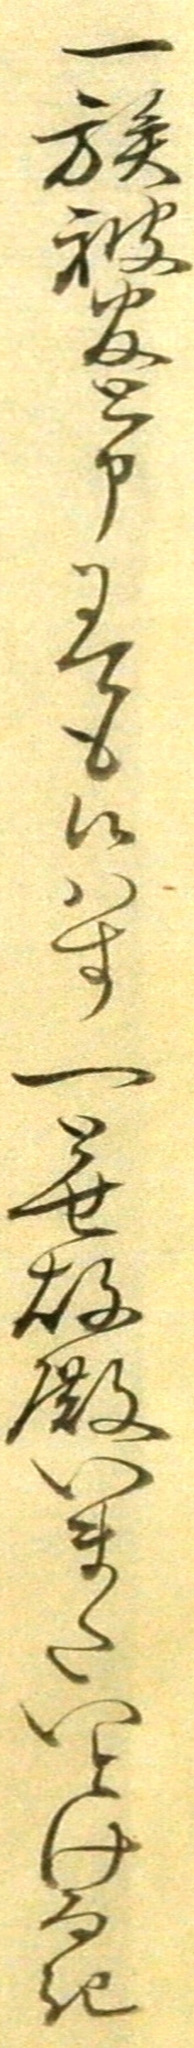一族被官と申にても候はす一とせ故殿いまたいとけなき
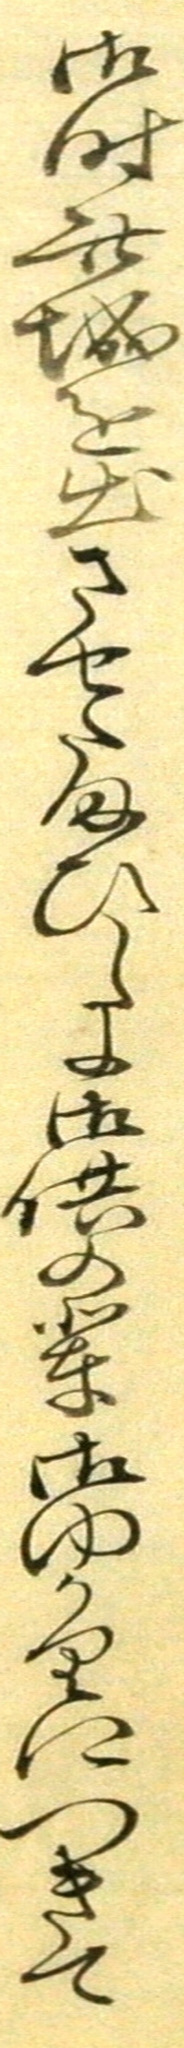御時此城を出させたまひしに御供の輩御ゆかりにつきて
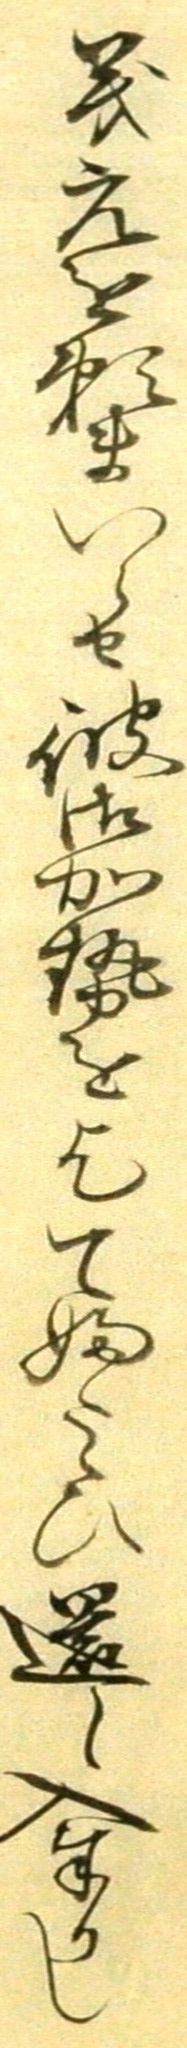義元を頼まいらせ彼御加勢を乞てふたゝひ還し入奉りし
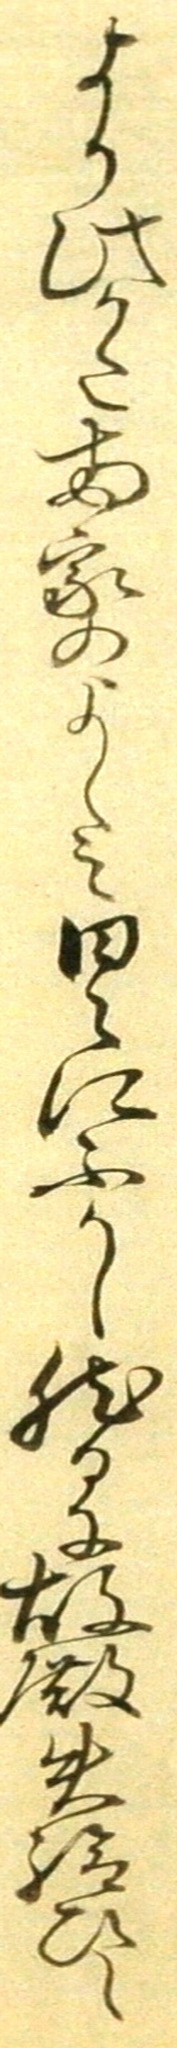より此かた両家のよしみ日々にふかし然るに故殿失給ひし
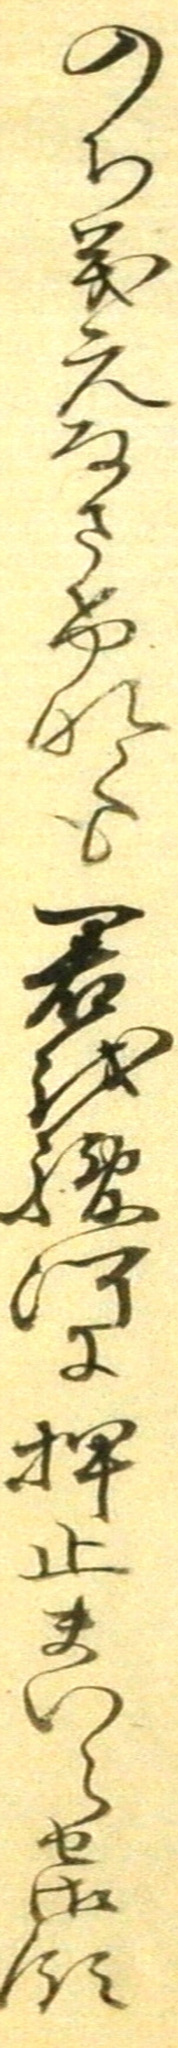のち義元なさけなくも君を駿河に押止まいらせ御領
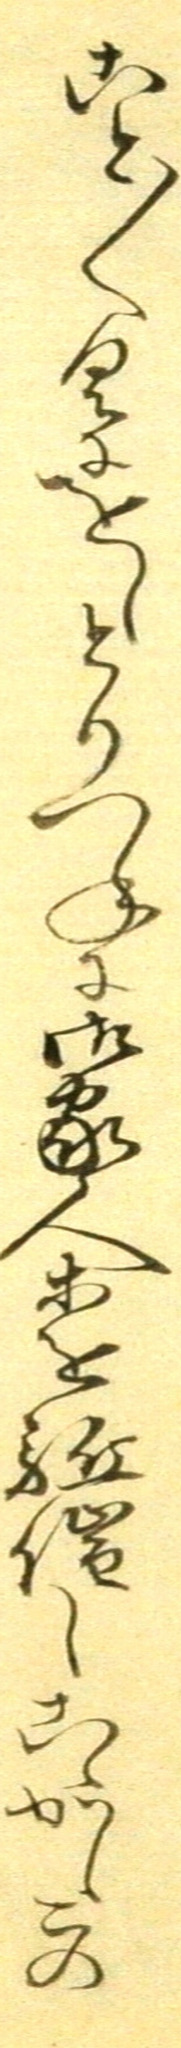こと〳〵くにをしとりつねに御家人等を駈催しこゝかしこの
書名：藩翰譜（五）
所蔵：伊那市立高遠町図書館・合同会社AMANE
